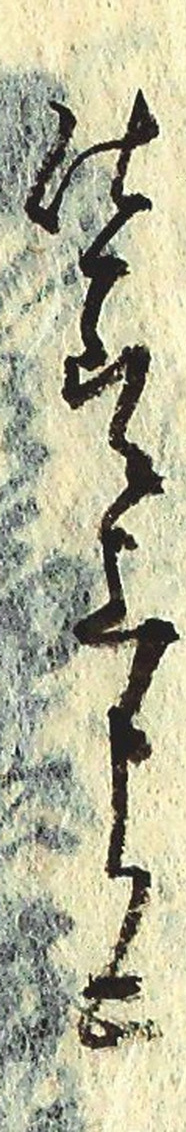仕差上申候以上
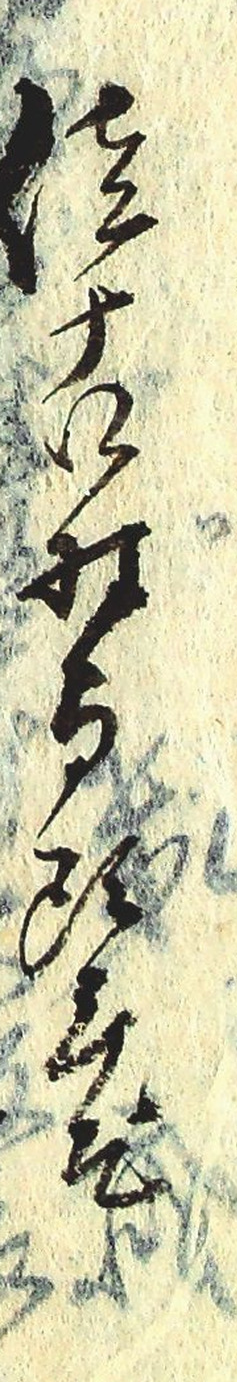佐古村与頭庄屋
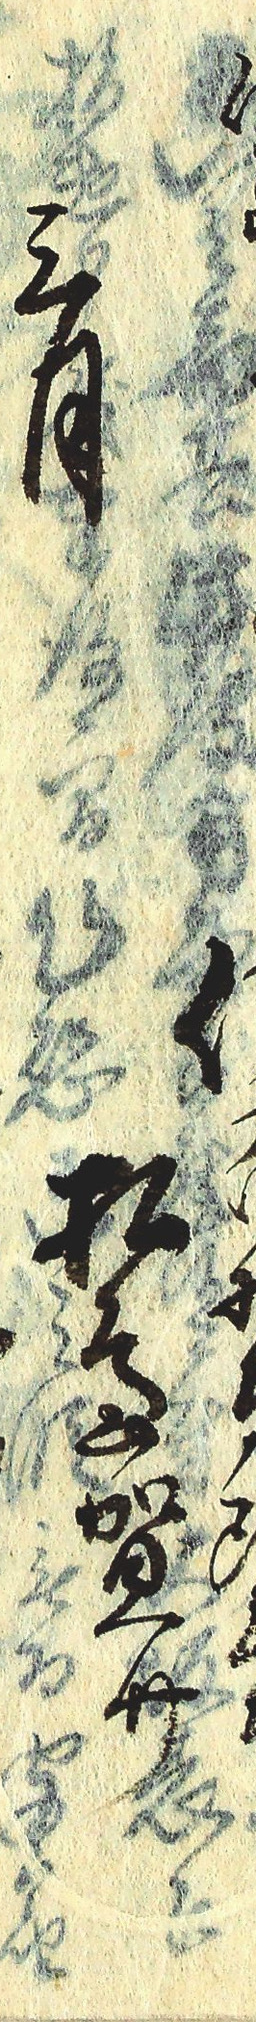三月松島賀介
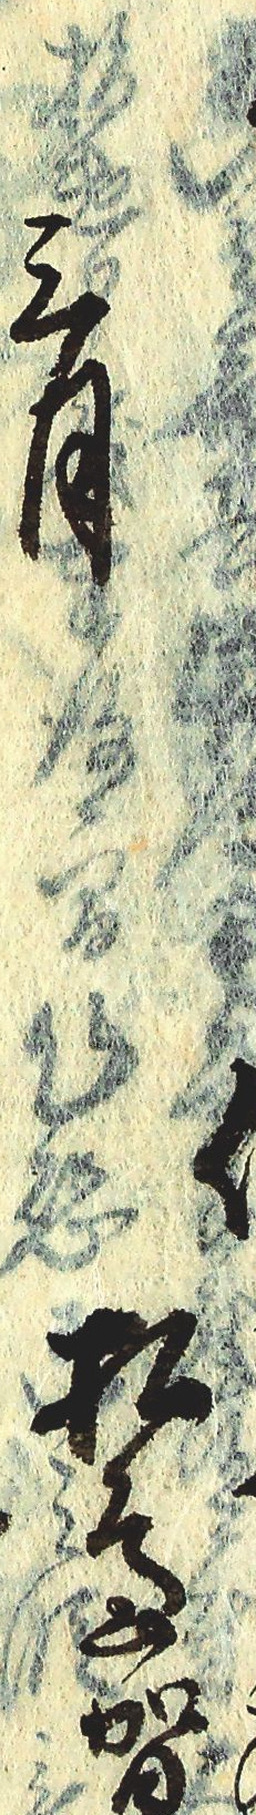三月松島賀介
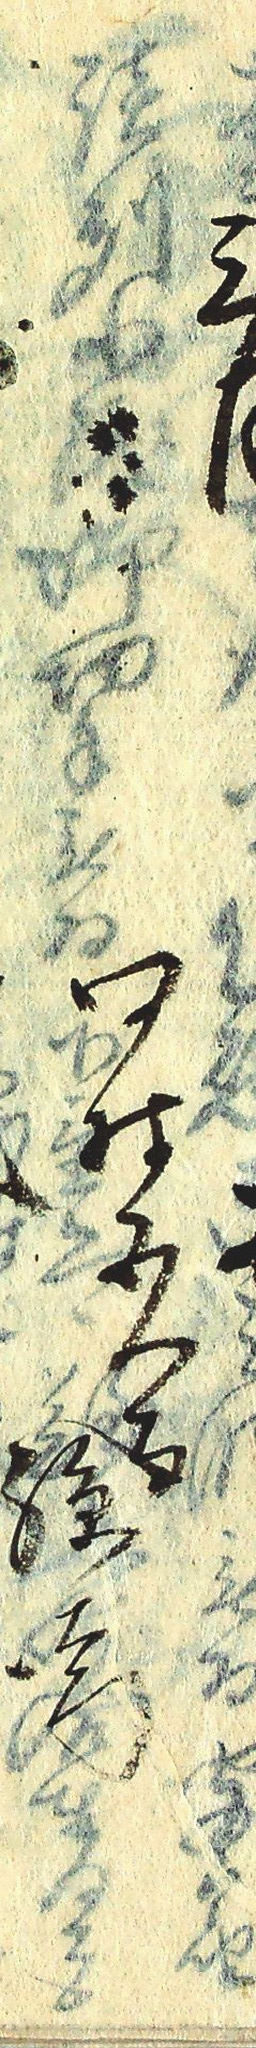同村五人与
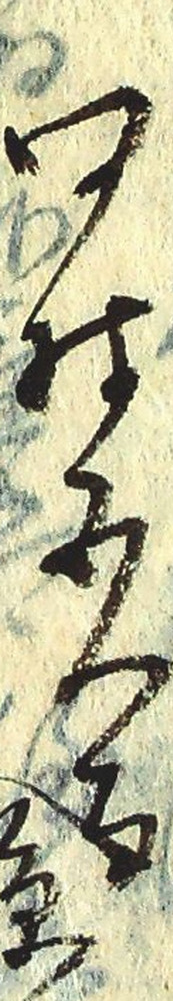同村五人与
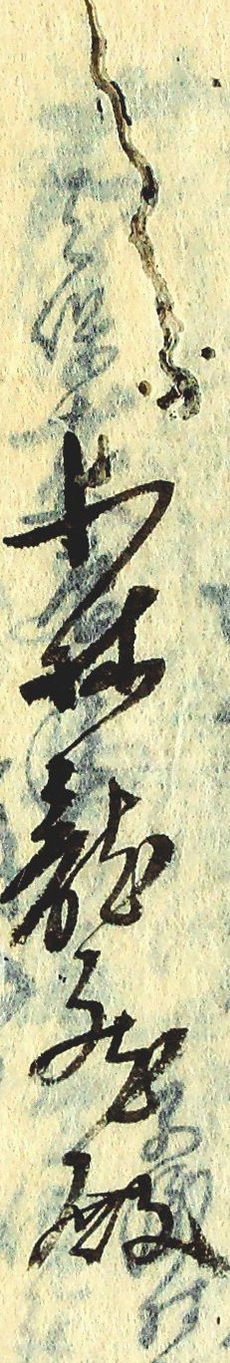小林龍蔵殿
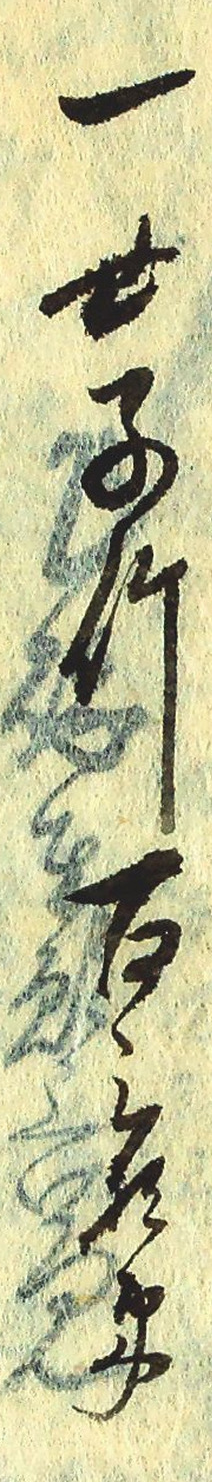一女子竹百三拾束
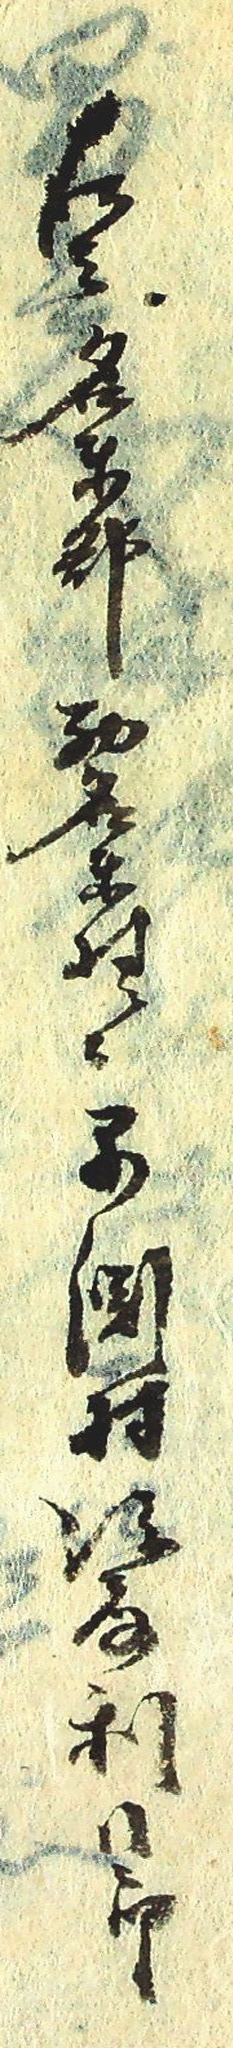右は名東郡西名東村にて早淵村後藤利八郎
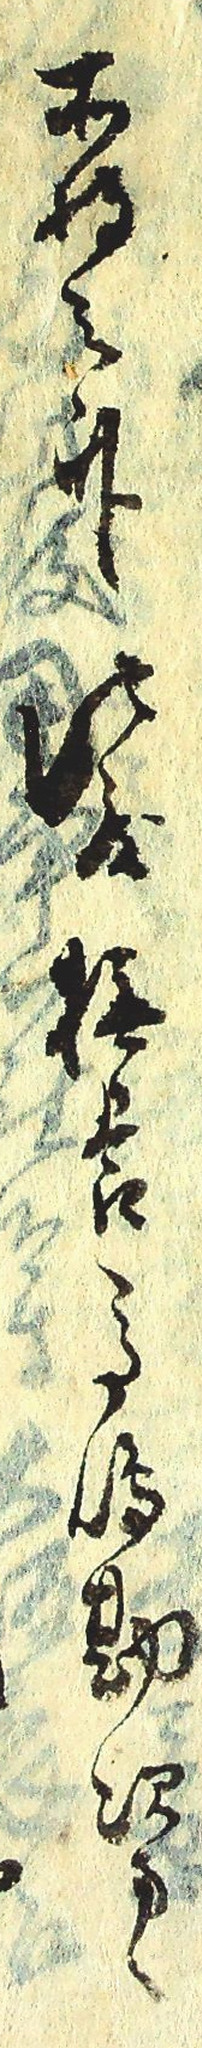所持之竹此度撫養高島勘次方へ
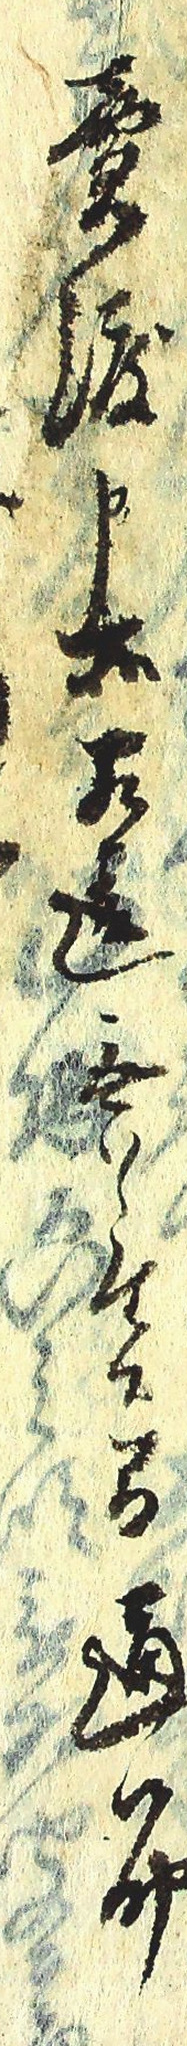売渡申所相違無御座候間道筋
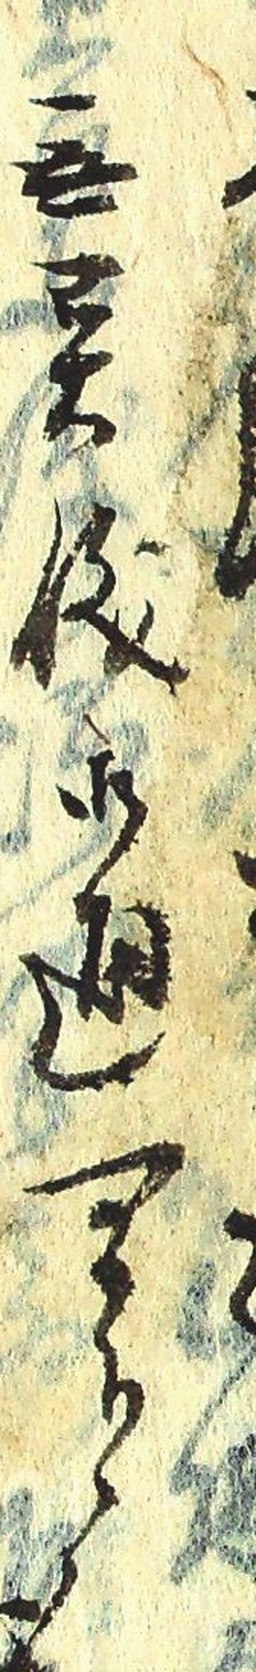無異儀御通可被下候以上
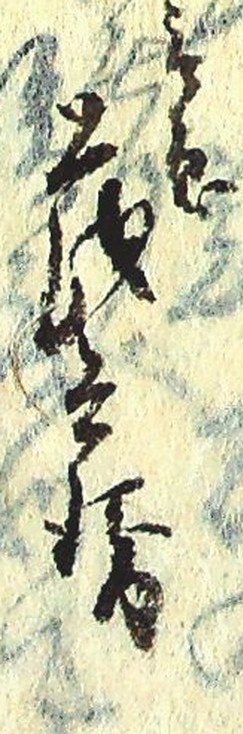茂兵衛
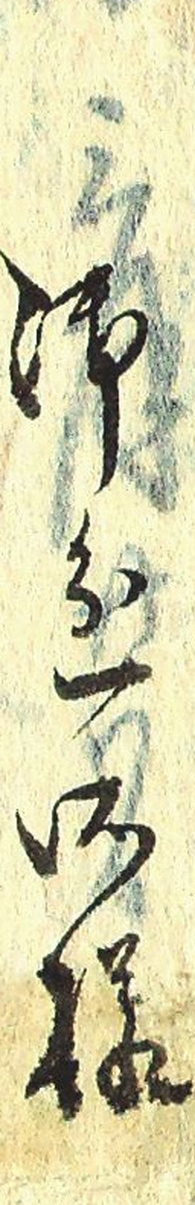御分一所様

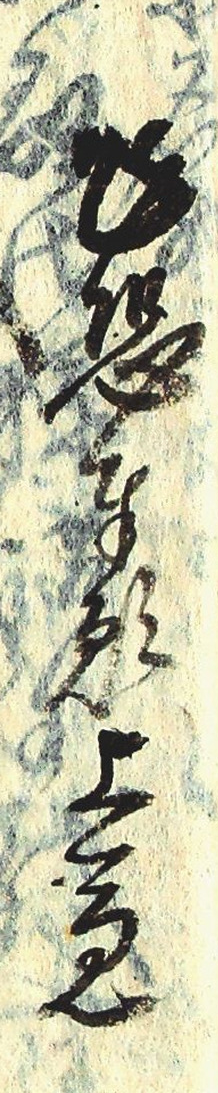乍恐奉願上覚
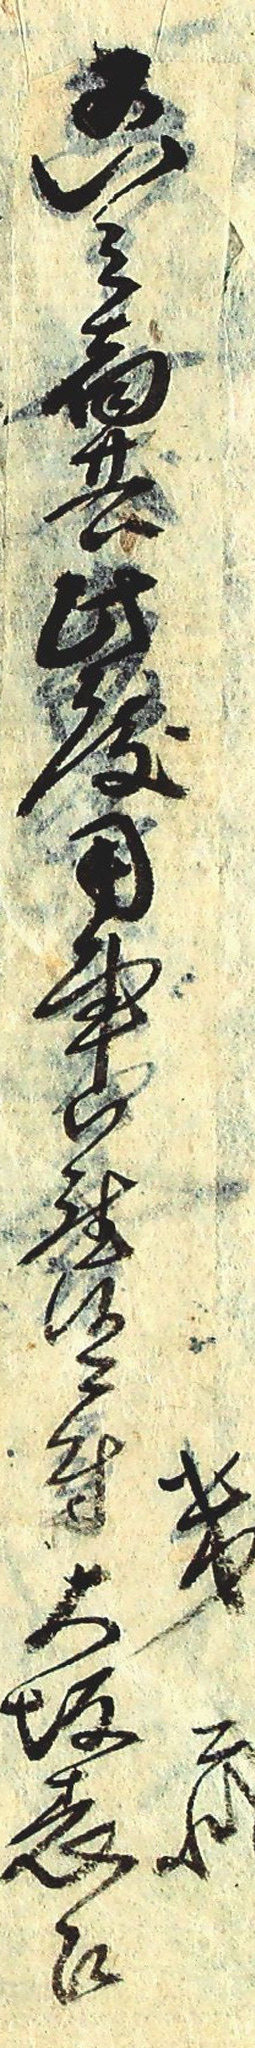右之者共此度用事御座候に付大坂表え
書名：諸御願書控(弐番）
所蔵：鳴門教育大学 Naruto University of Education
